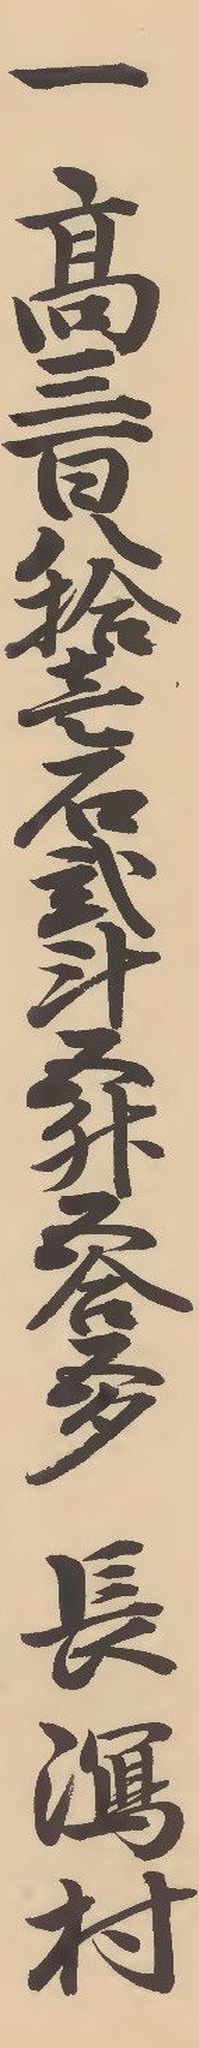一高三百八拾壱石弐斗五升五合五勺長潟村
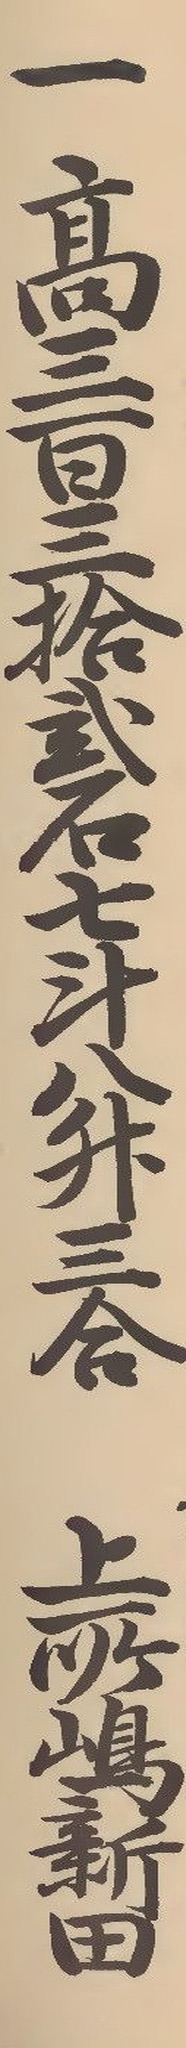一高三百三拾弐石七斗八升三合上所島新田
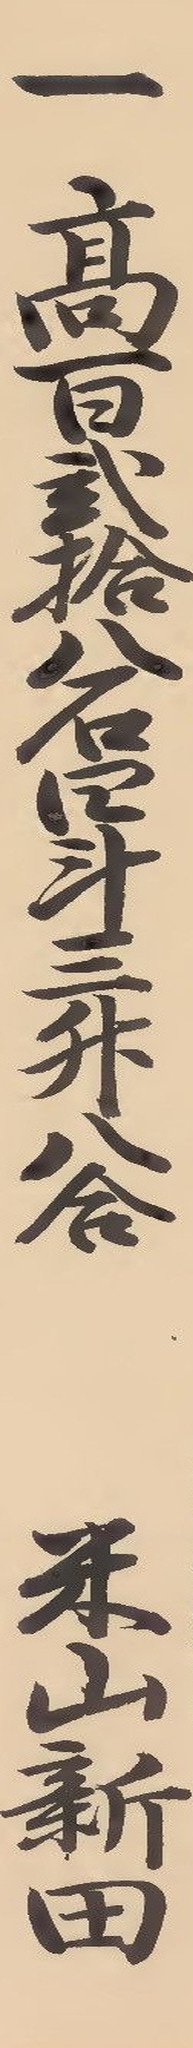一高百弐拾八石四斗三升八合米山新田
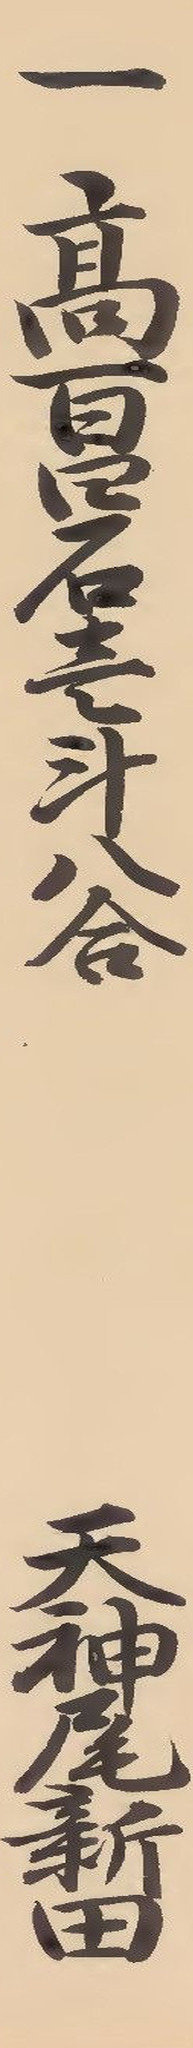一高百四石壱斗八合天神尾新田
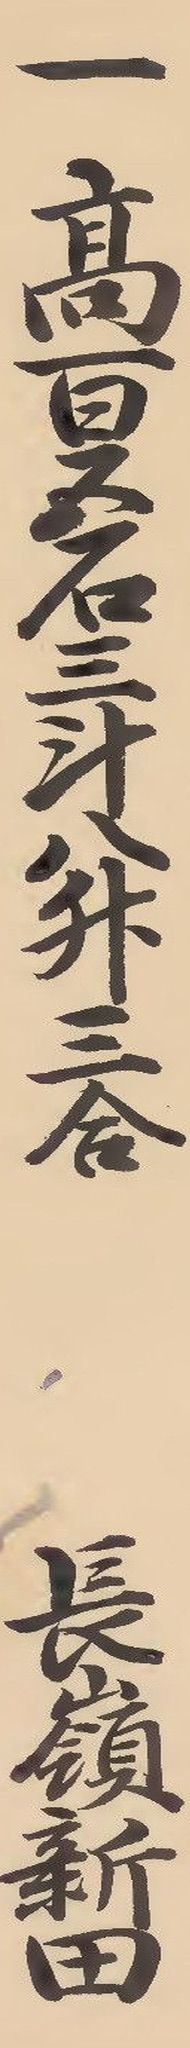一高百五石三斗八升三合長嶺新田

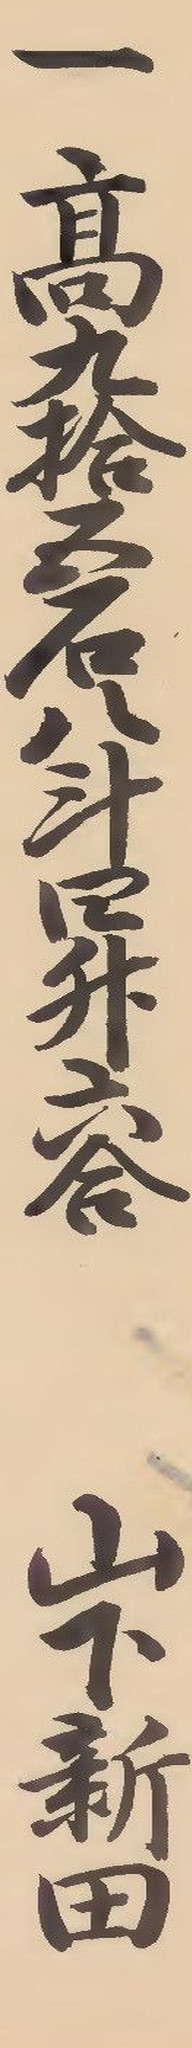一高九拾五石八斗四升六合山下新田
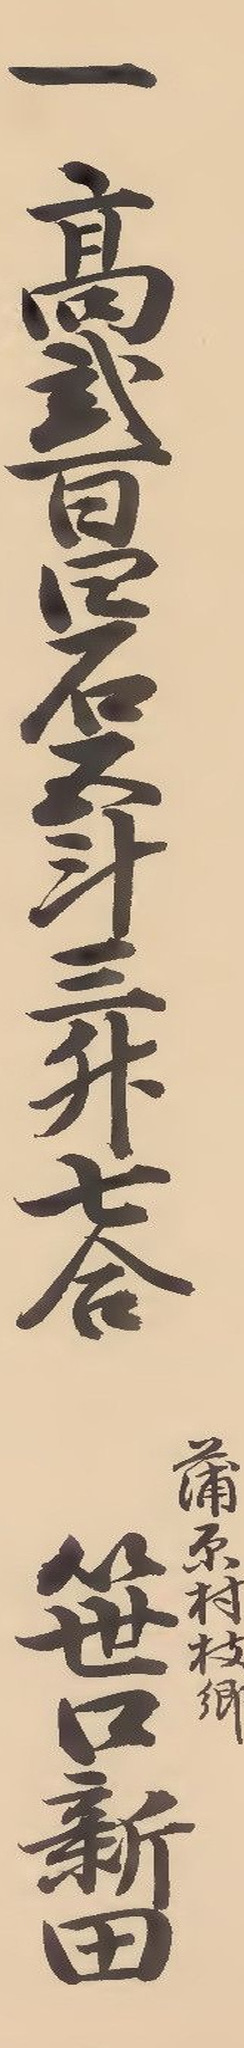一高弐百四石五斗三升七合笹口新田
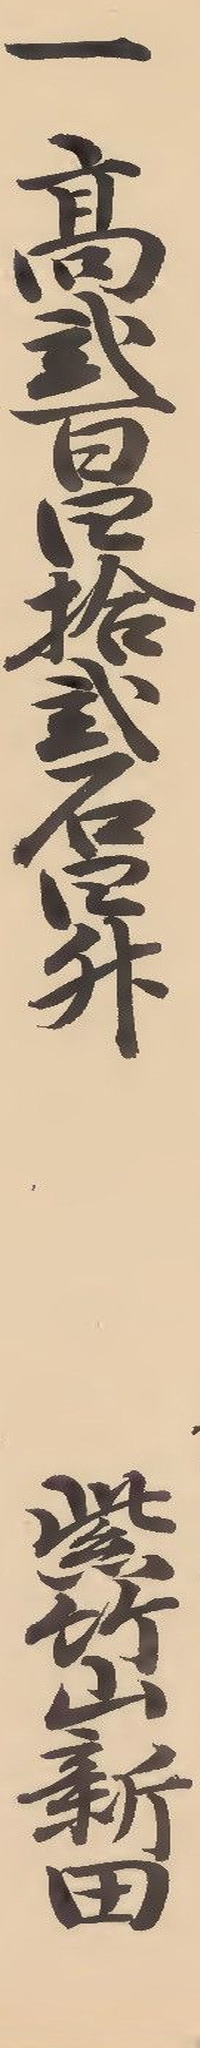一高弐百四拾弐石四升紫竹山新田
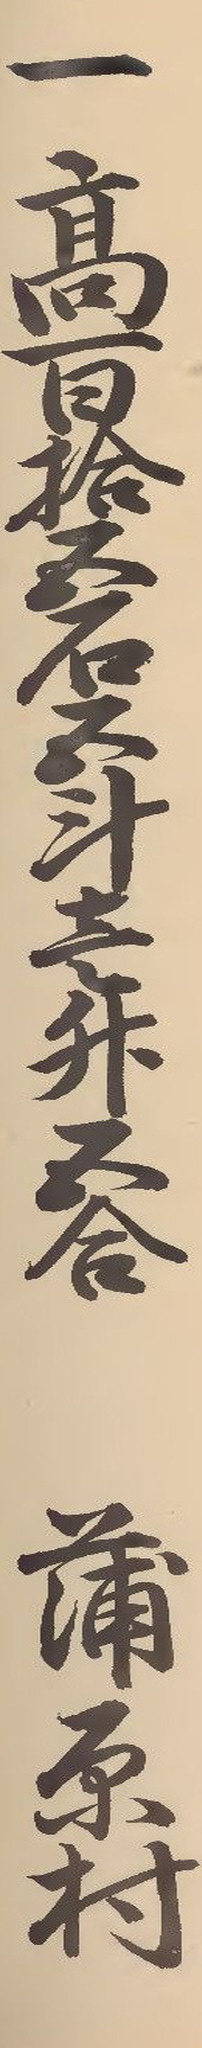一高百拾五石五斗壱升五合蒲原村
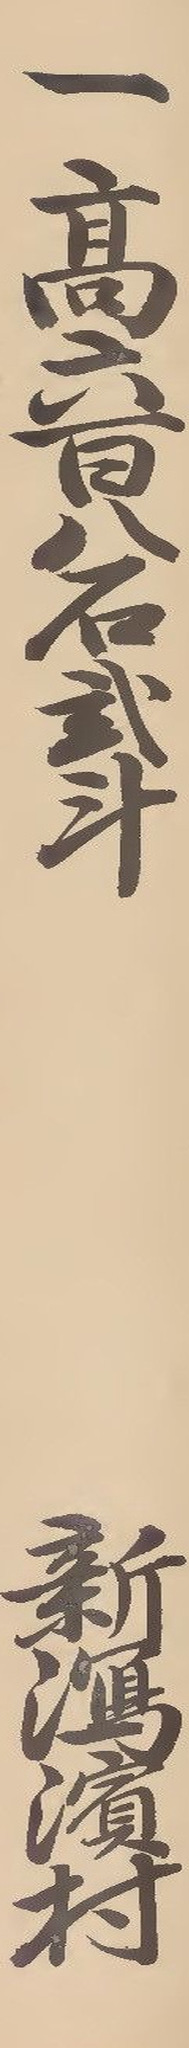一高六百八石弐斗新潟浜村
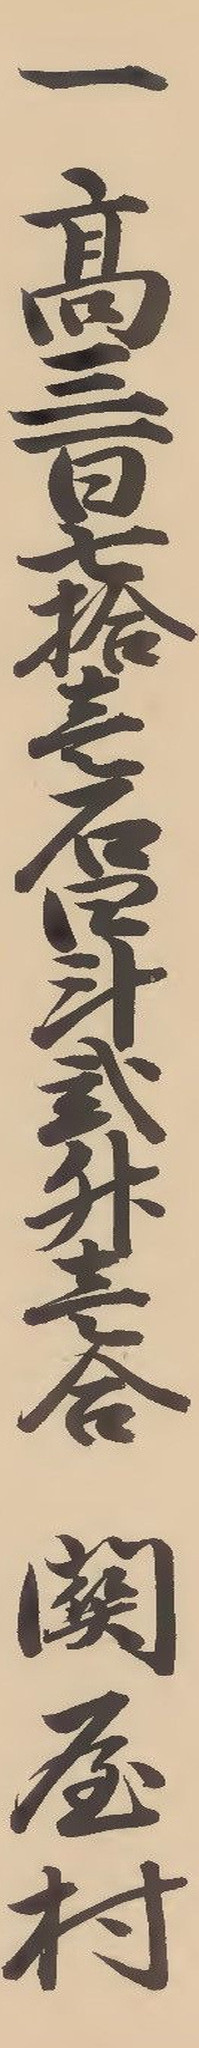一高三百七拾壱石四斗弐升壱合関屋村
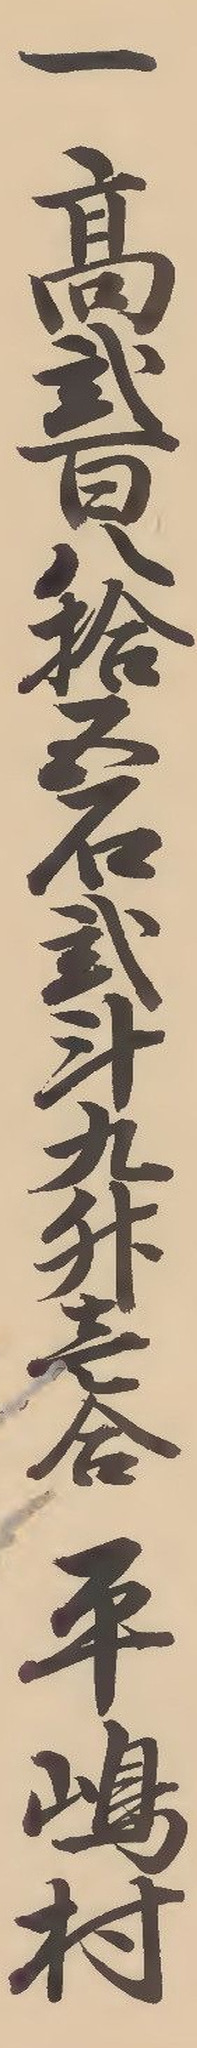一高弐百八拾五石弐斗九升壱合平島村

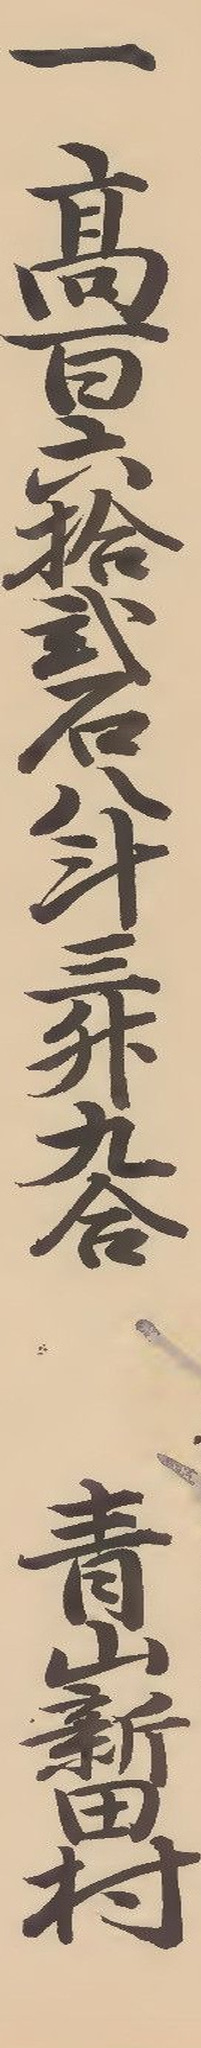一高百六拾弐石八斗三升九合青山新田村
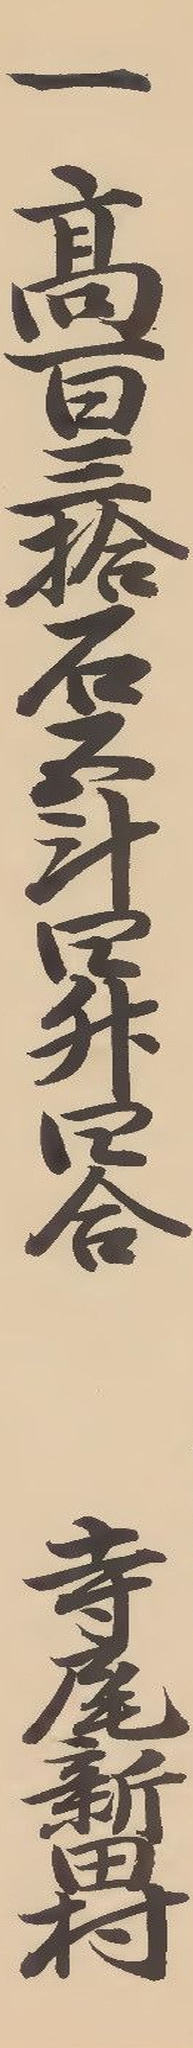一高百三拾石五斗四升四合寺尾新田村
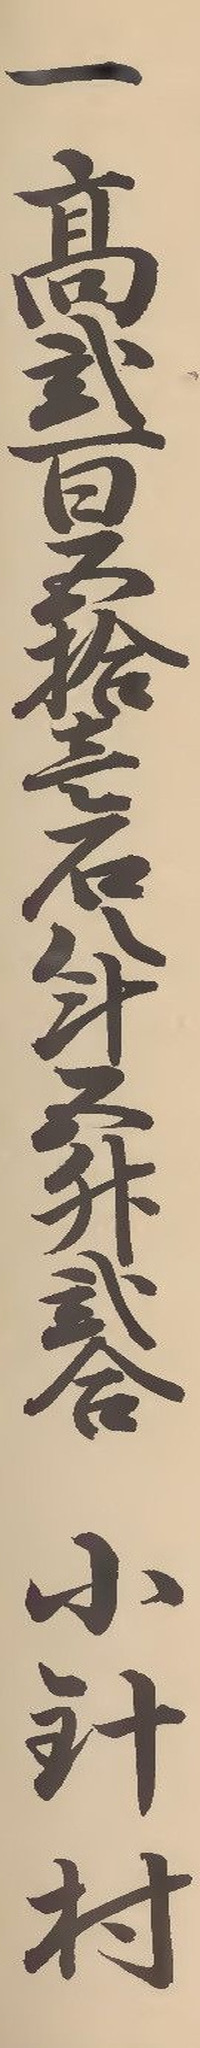一高弐百五拾壱石八斗五升弐合小針村
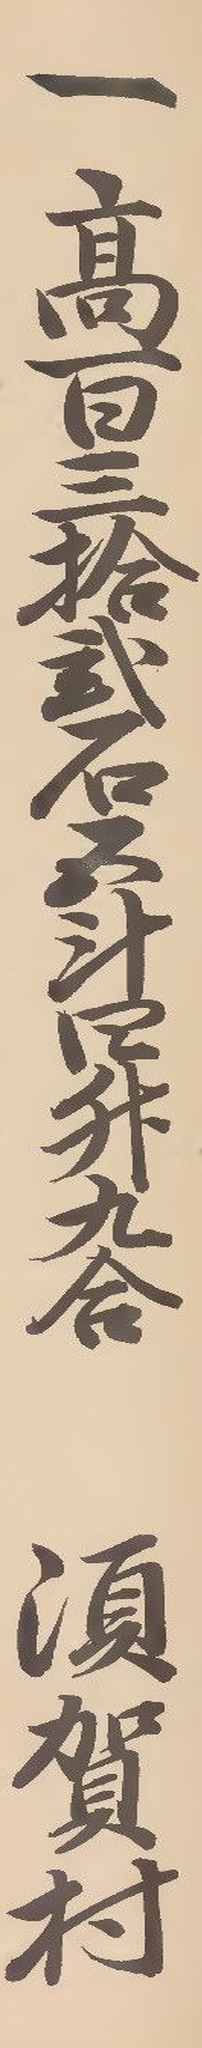一高百三拾弐石五斗四升九合須賀村
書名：越後国郷帳　下
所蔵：国立公文書館 National Archives of Japan
